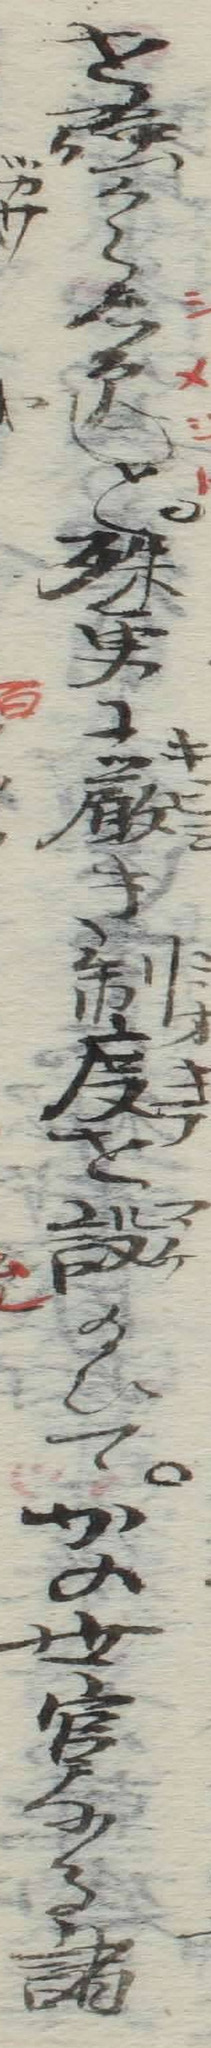を強からしめじと。殊更に厳き制度を設給ひて。かの世官なる諸
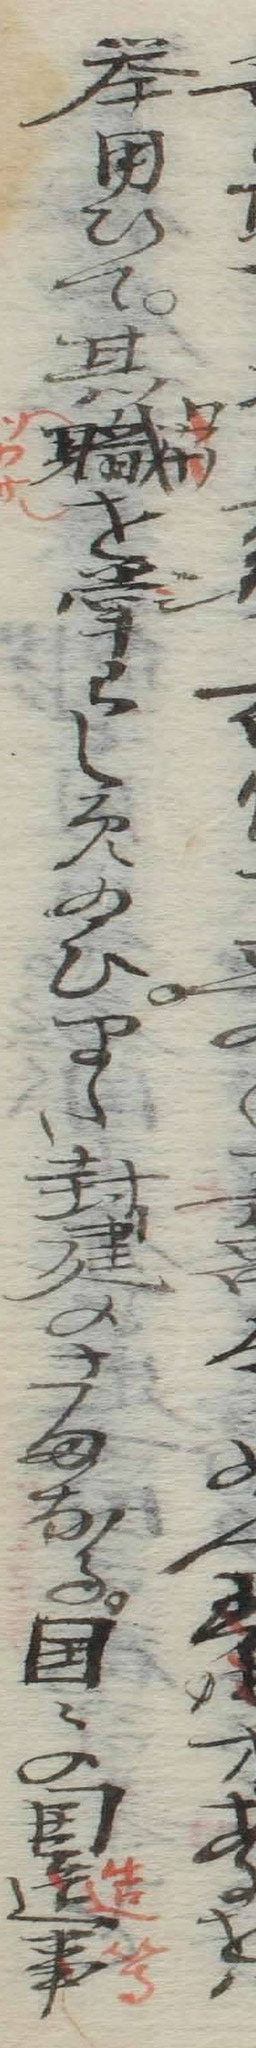挙用ひて。其職を掌らしめ給ひ。また封建のさまなる。国々の国造等

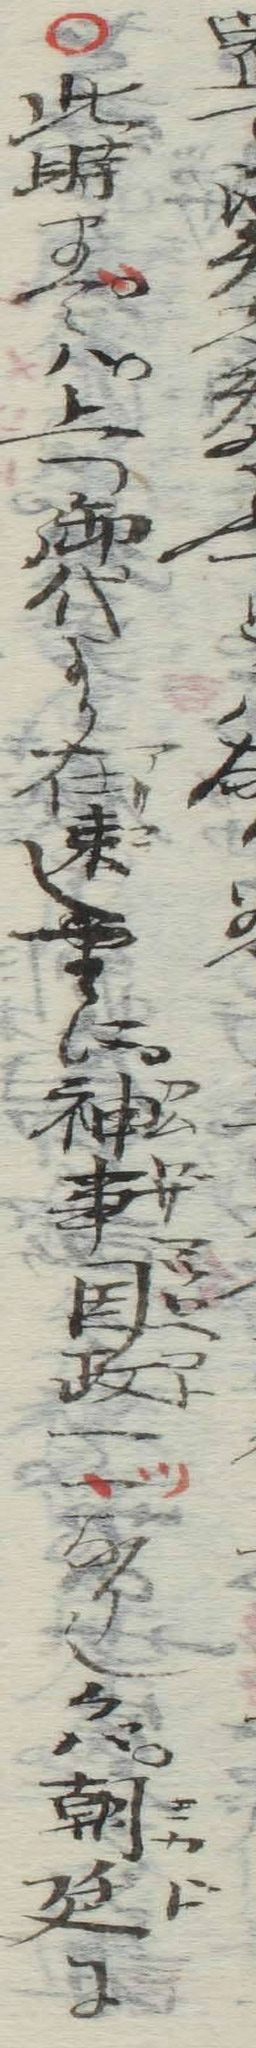〇此時までは。上つ御代より在来しまゝに。神事国政一つなりしかば。朝廷に
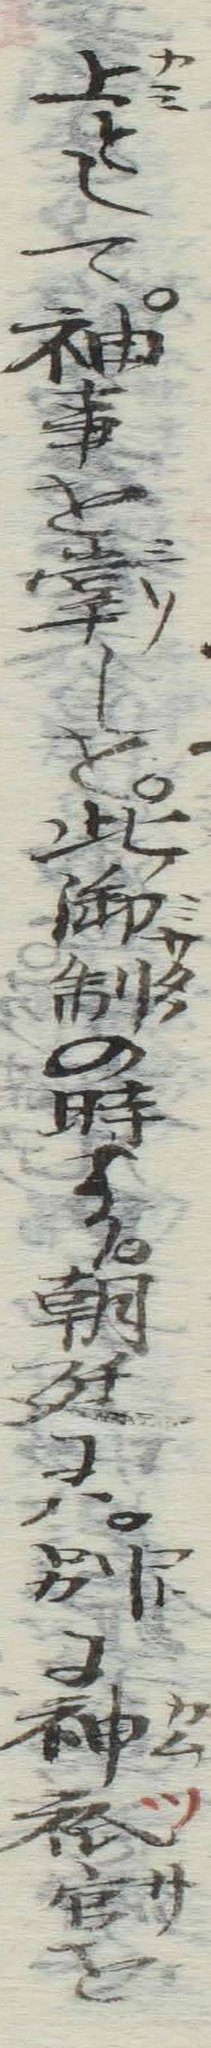上として。神事を掌しを。此御制の時より。朝廷には。別に神祇官を
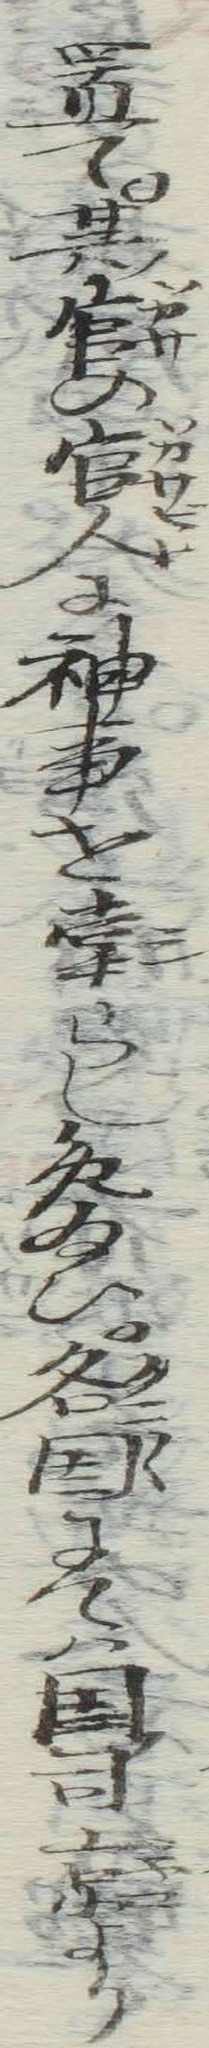置て。其官の官人に神事を掌らしめ給ひ。各国にては国司京より
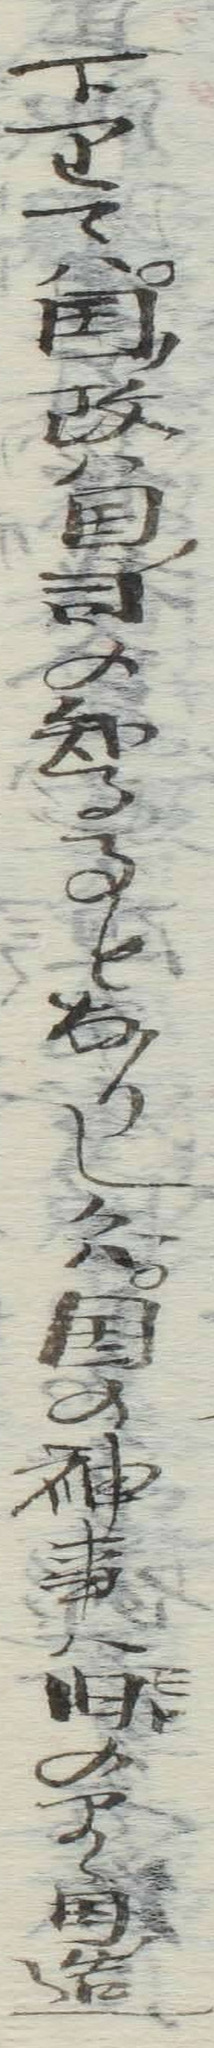下りては。国改は国司の知る事となりしかば。国の神事は旧のまゝ国造
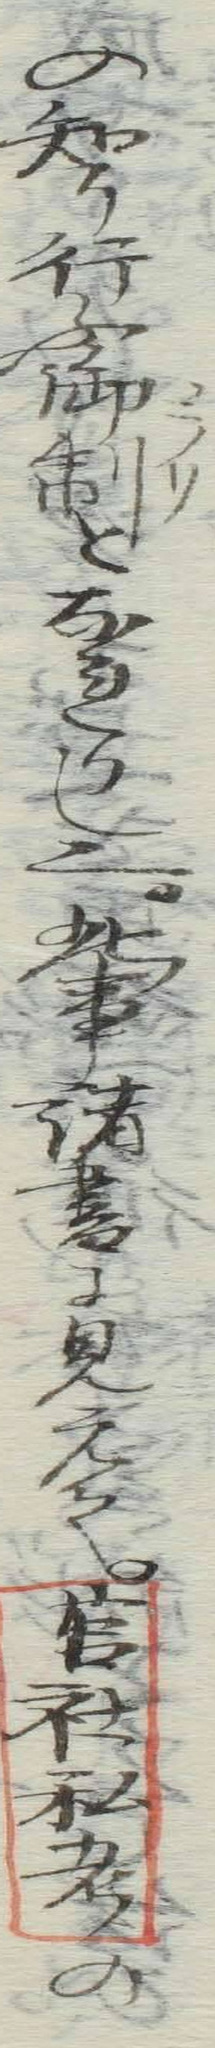の知り行ふ御制となれりし也。此事諸書に見えて。官社私考の
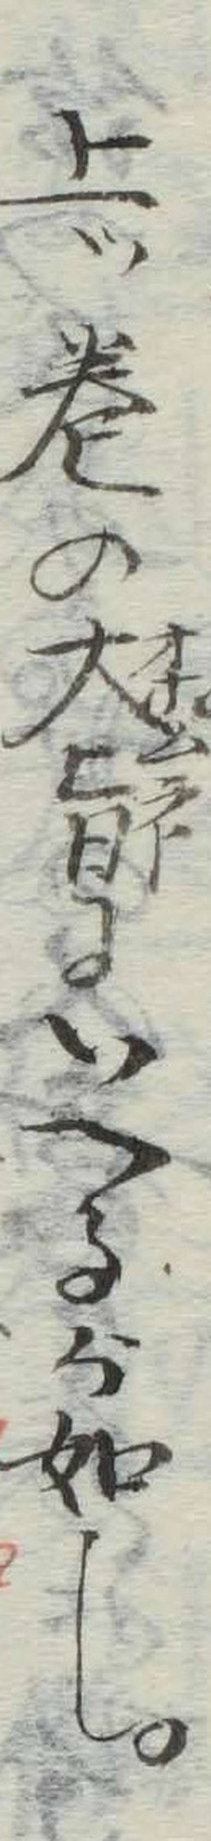上ツ巻の大旨にいへるが如し。
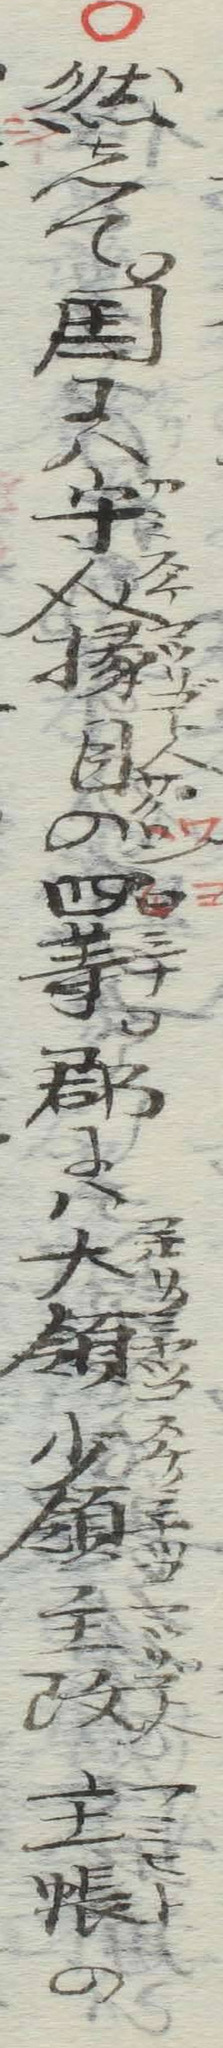〇然して。国には守介掾目の四等。郡には大領少領主改主帳の
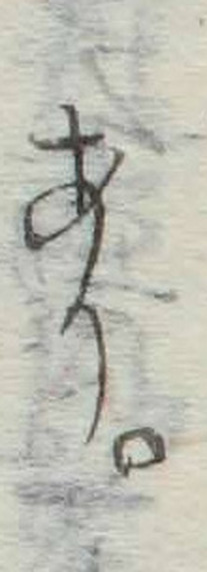あり。

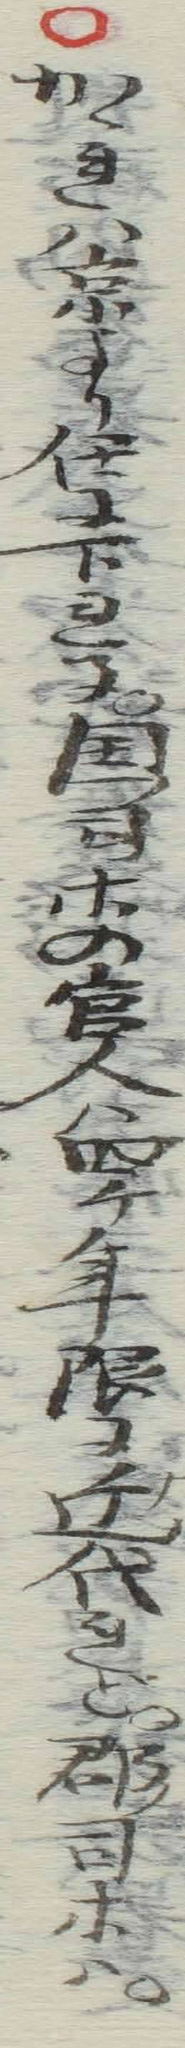〇かゝれは京より任に下れる。国司等の官人は四ヶ年限に遷代れど。郡司等は。
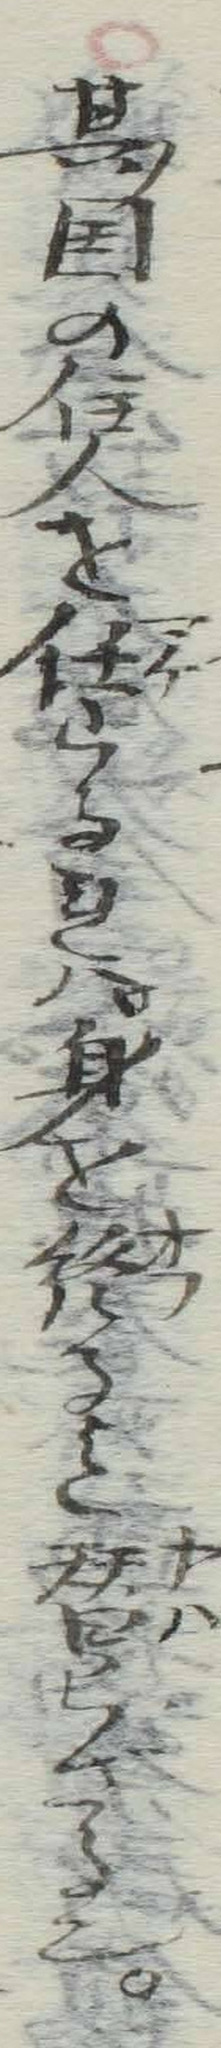其国の住人を任らるれは。身を終ること替らざる也。
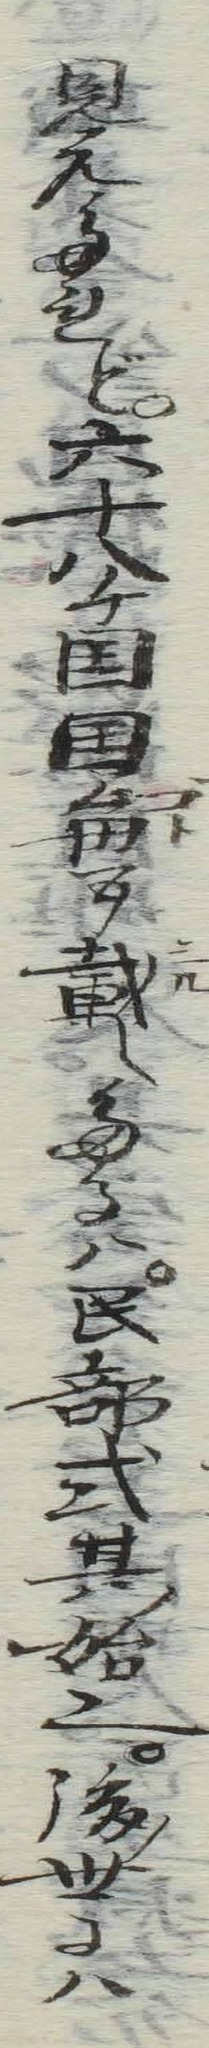見えるれど。六十八ケ国国毎に載したるは。民部式其始也。後世には
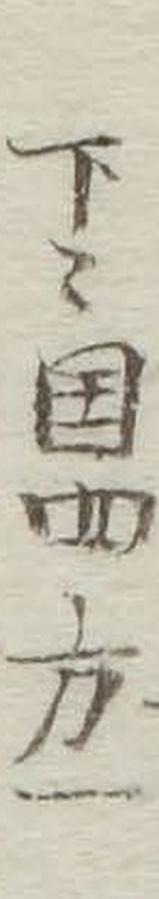下々国四方一
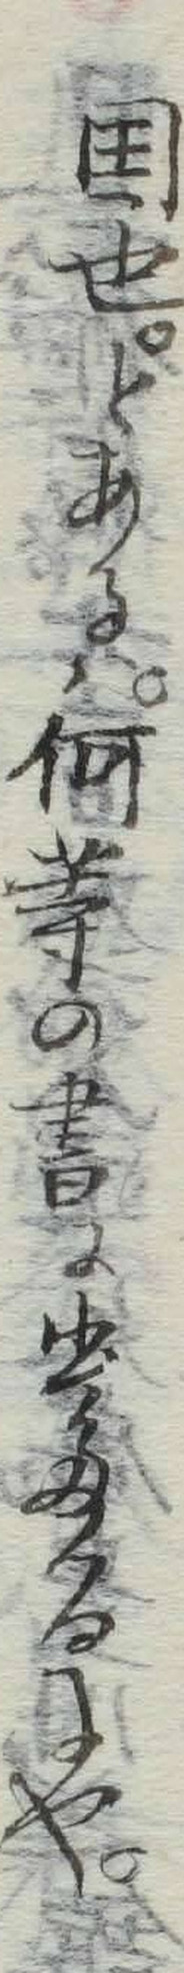国也。とあるは。何等の書に出たるにや。
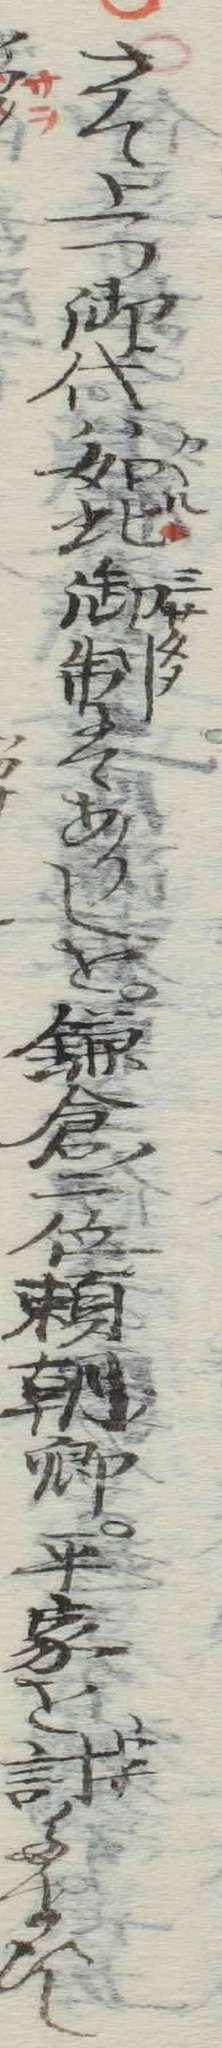〇さて上つ御代は如御制にてありしを。鎌倉二位頼朝卿。平家を討たまひし
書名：三河国古跡考
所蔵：国文学研究資料館
